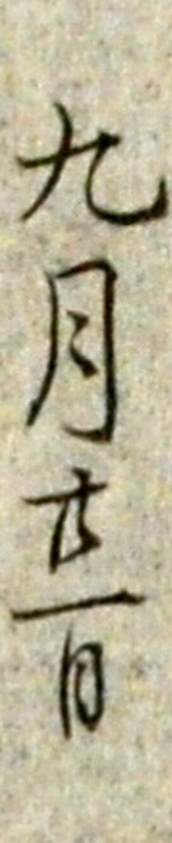九月廿一日
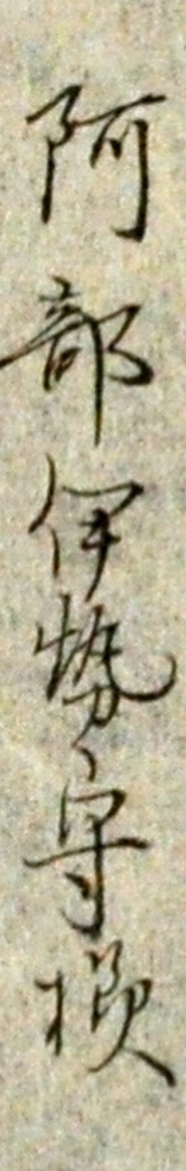阿部伊勢守様
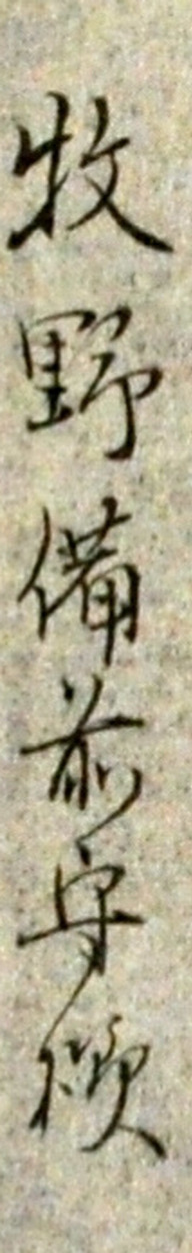牧野備前守様
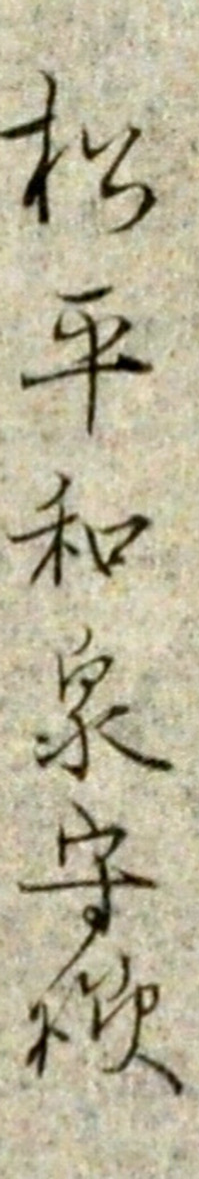松平和泉守様
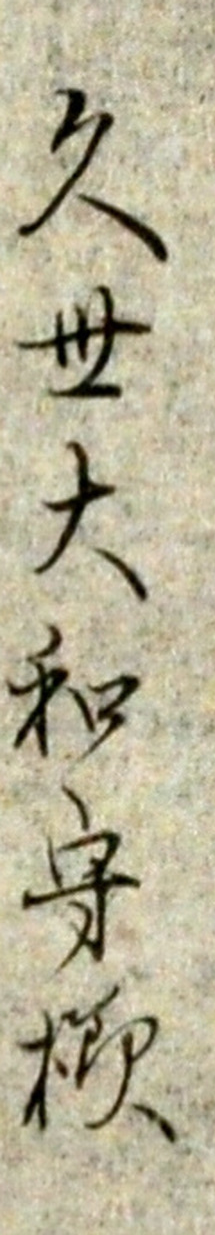久世大和守様
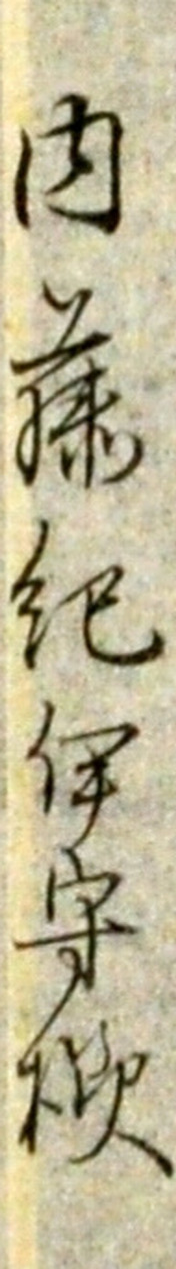内藤紀伊守様
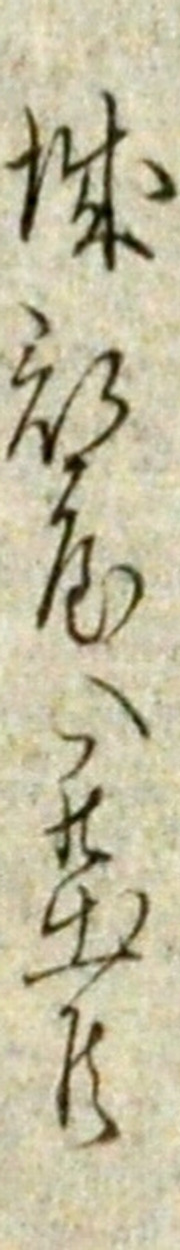登城部屋へ罷出候
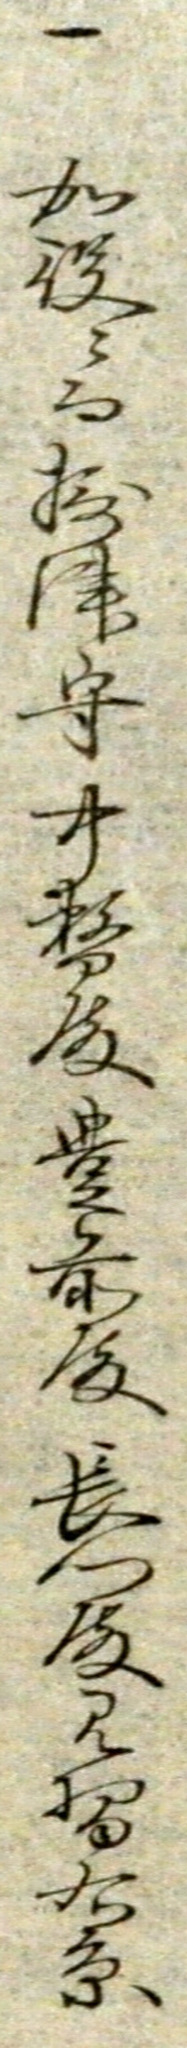一加役ニ而摂津守中務殿豊前殿長門殿見習右京
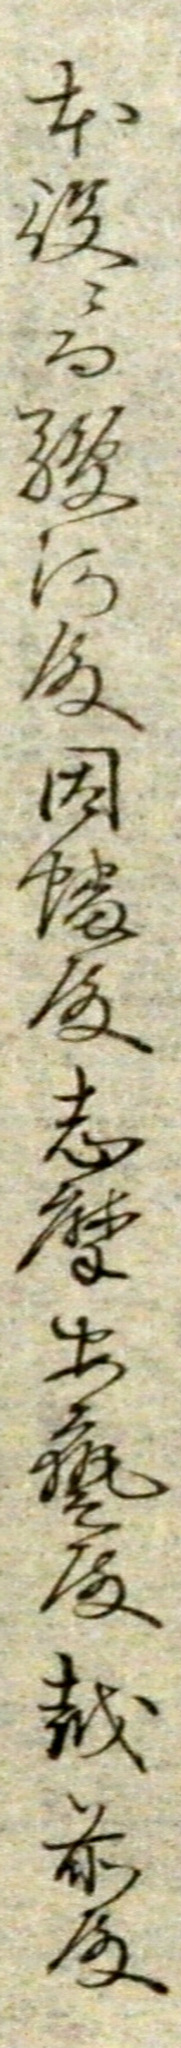本役ニ而駿河殿因幡殿志摩安芸殿越前殿
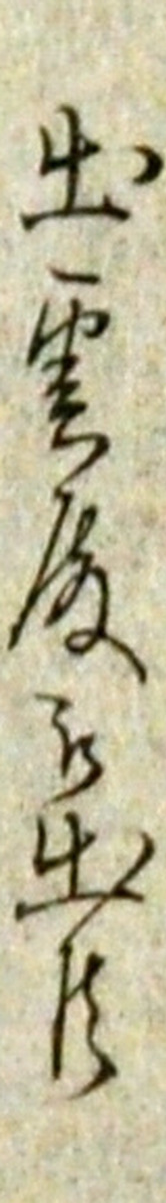出雲殿被出候

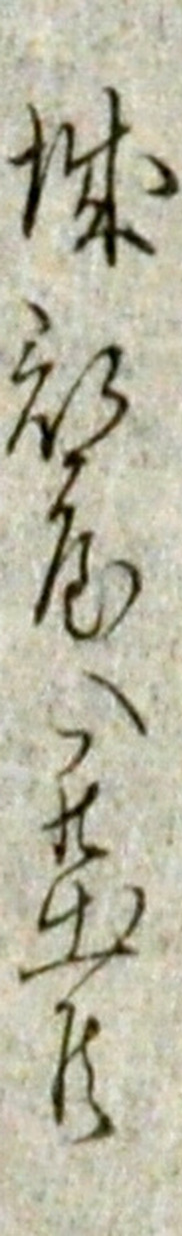城部屋へ罷出候
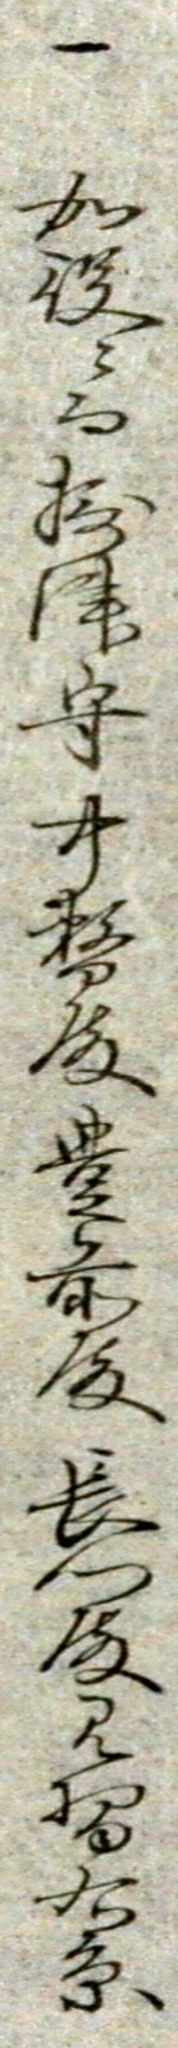一加役ニ而攝津守中務殿豊前殿長門殿見習右京
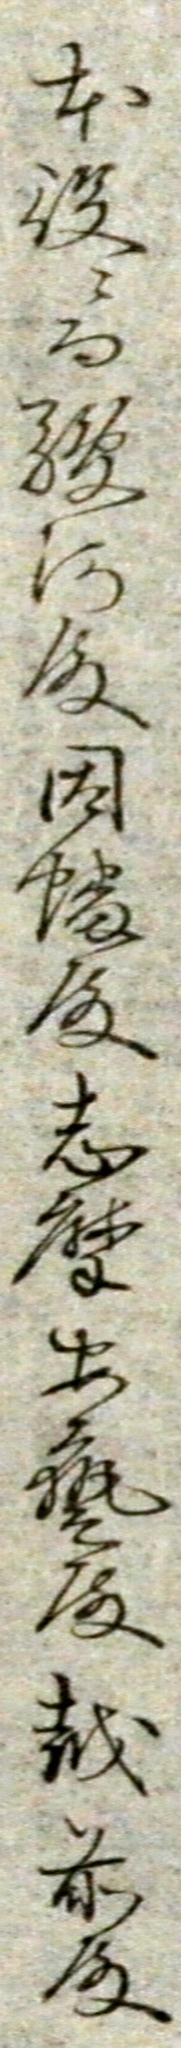本役ニ而駿河殿因幡殿志摩安藝殿越前殿
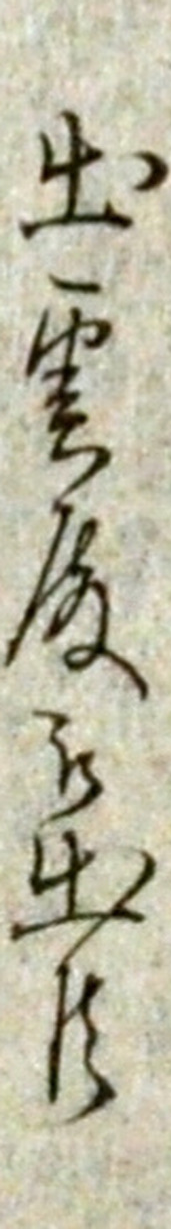出雲殿被出候
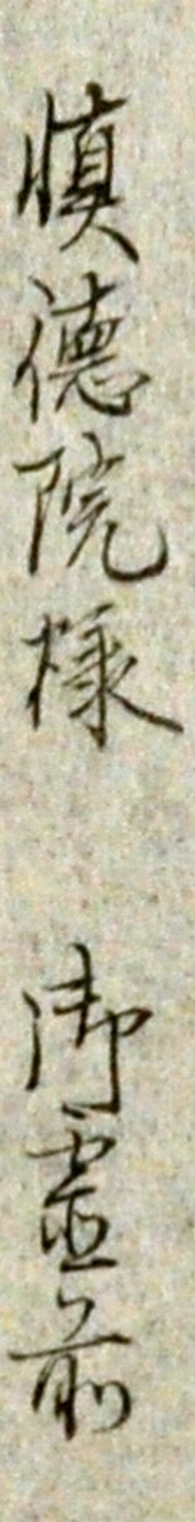慎徳院様御霊前
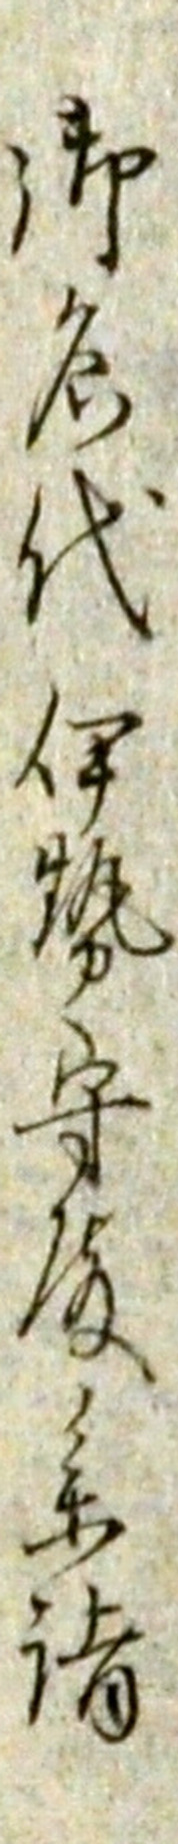御名代伊勢守殿参詣
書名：日光御名代相勤候節ノ留
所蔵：伊那市立高遠町図書館・合同会社AMANE
